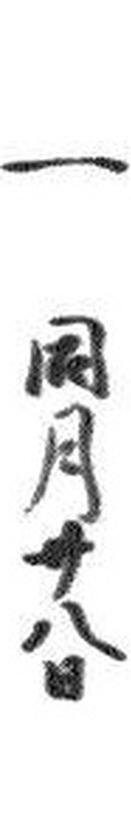一同月廿八日

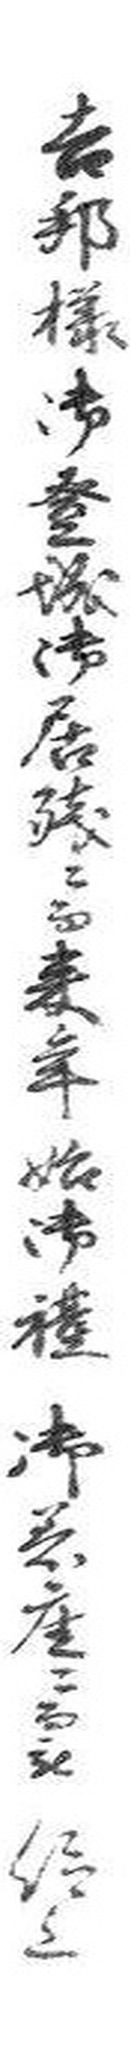吉邦様御登城御居残ニ而来年始御礼御着座ニ而仰上
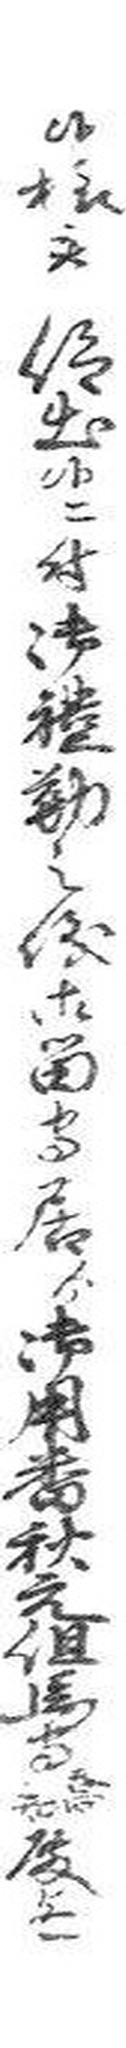候様被仰出候ニ付御礼勤之儀御留守居ゟ御用番秋元但馬守喬知殿迄
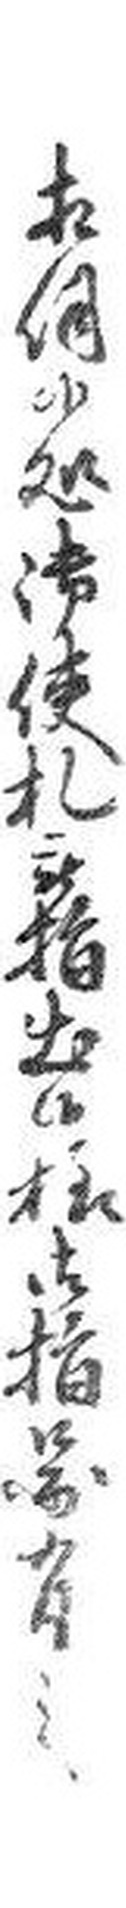相伺候処御使札被指出候様御指図有之
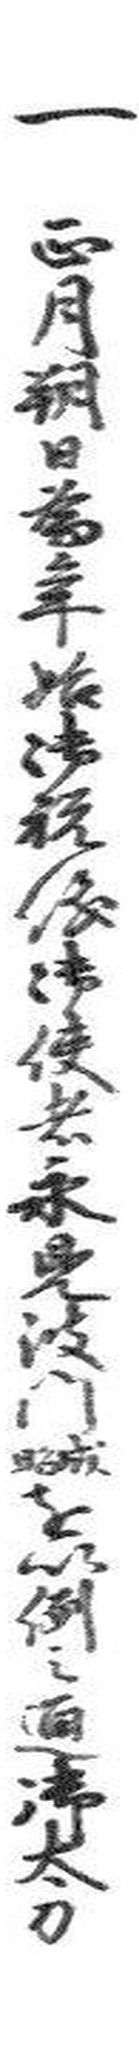一正月朔日為年始御祝儀御使者永見波門成昭を以例之通御太刀
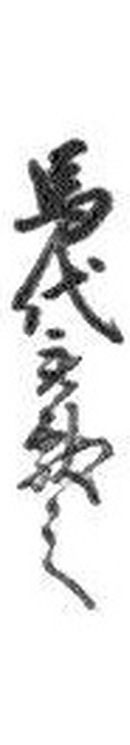馬代被献之
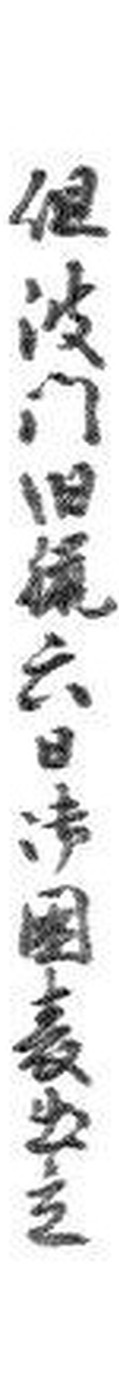但波門旧臘六日御国表出立
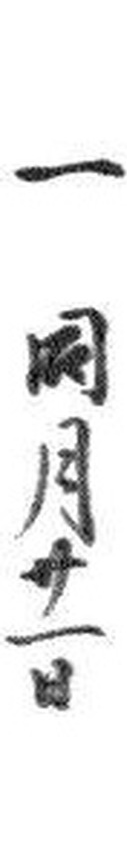一同月廿一日
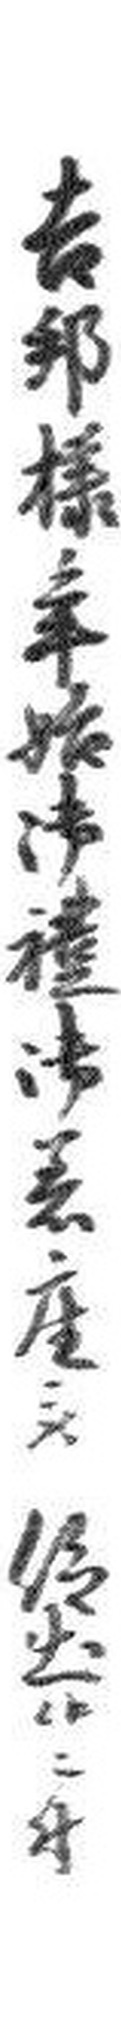吉邦様年始御礼御着座被仰出候ニ付
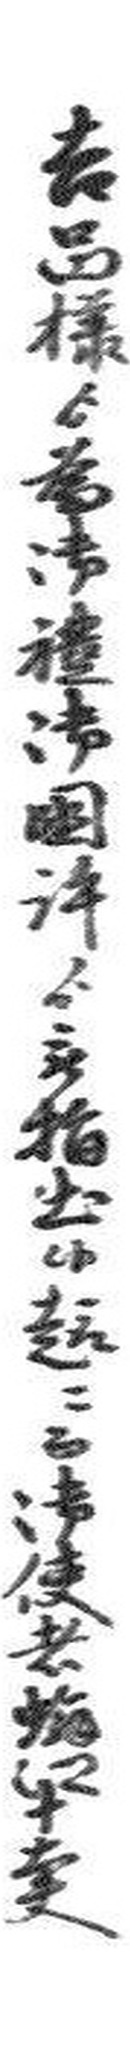吉品様ゟ為御礼御国許ゟ被指出候趣ニ而御使者蠏江十大夫

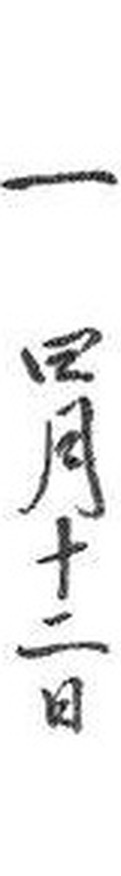一四月十二日
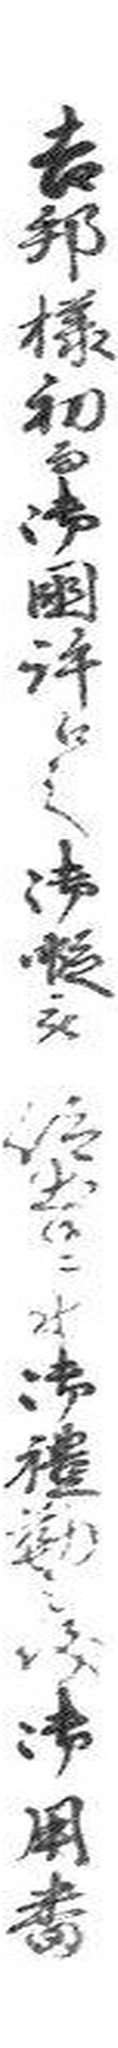吉邦様初而御国許江之御暇被仰出候ニ付御礼勤之儀御用番
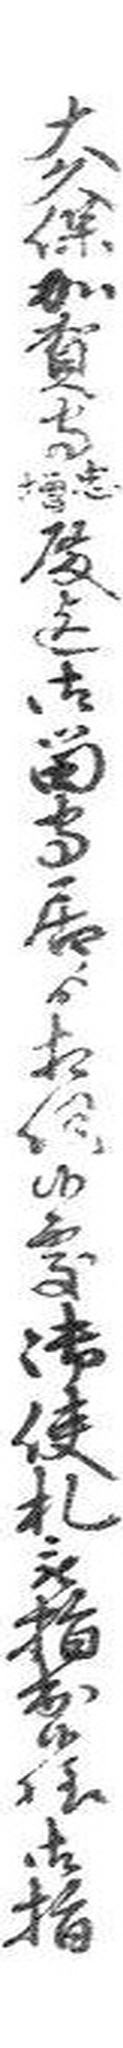大久保加賀守忠増殿迄御留守居ゟ相伺候処御使札被指出候様御指
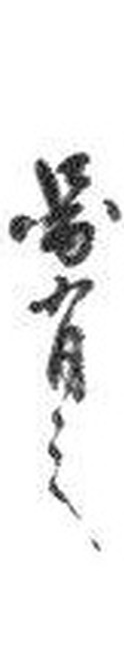図有之
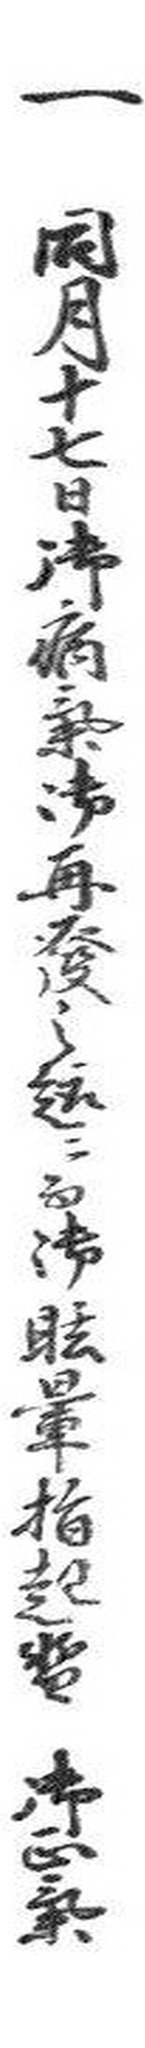一同月十七日御病気御再発之趣ニ而御眩暈指起暫御正気
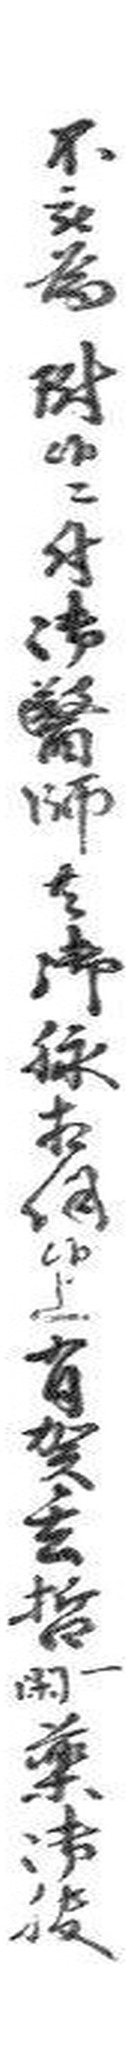不被為附候ニ付御医師共御脈相伺候上有賀玄哲一閑薬御服
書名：家譜 二十六 吉品公 従宝永七年到正徳二年
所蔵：福井県文書館 Fukui Prefectural Archives
